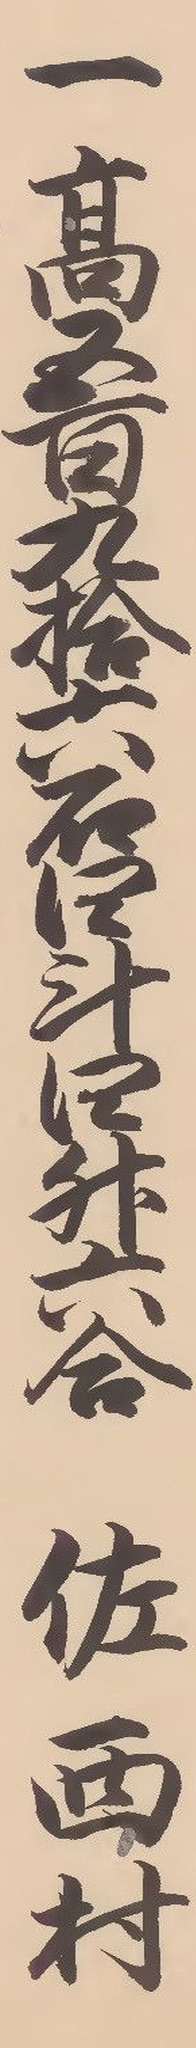一高五百九拾六石四斗四升六合佐西村

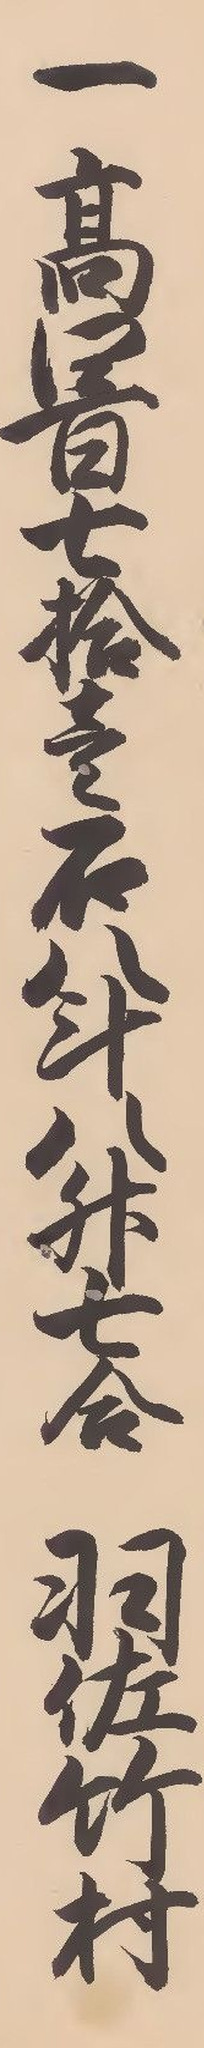一高四百七拾壱石八斗八升七合羽佐竹村
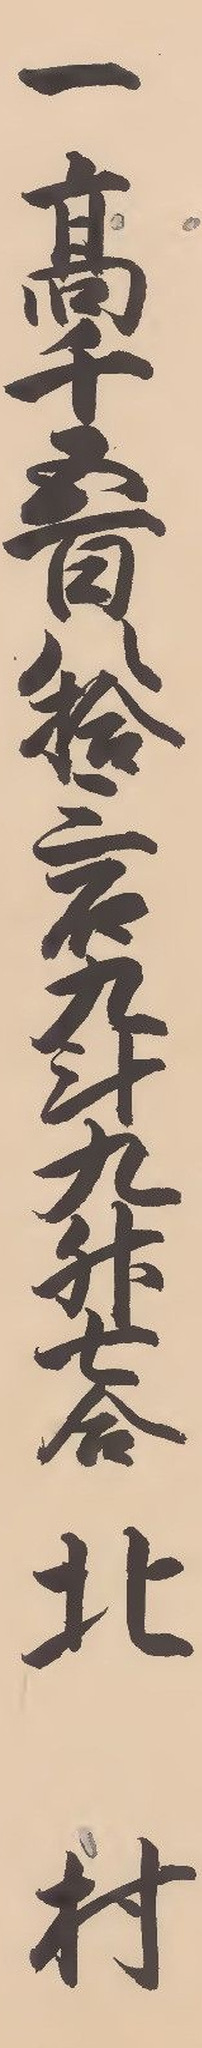一高千五百八拾三石九斗九升七合北村
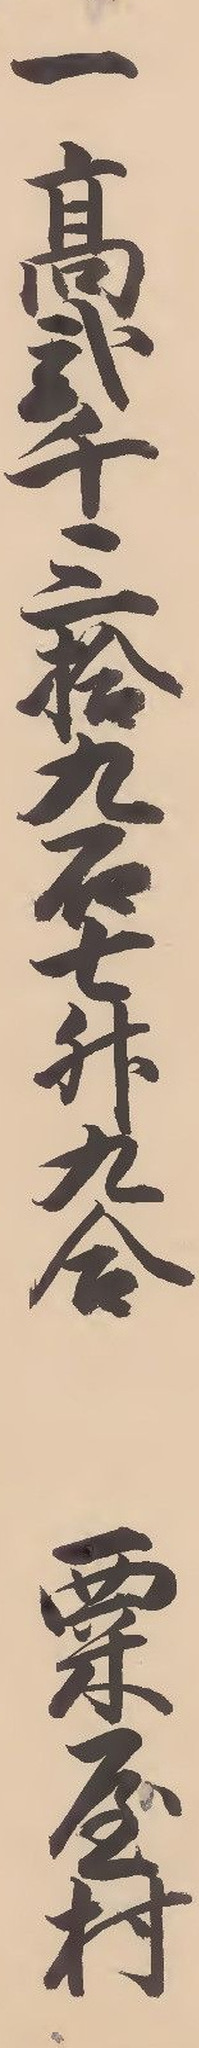一高弐千三拾九石七升九合粟屋村
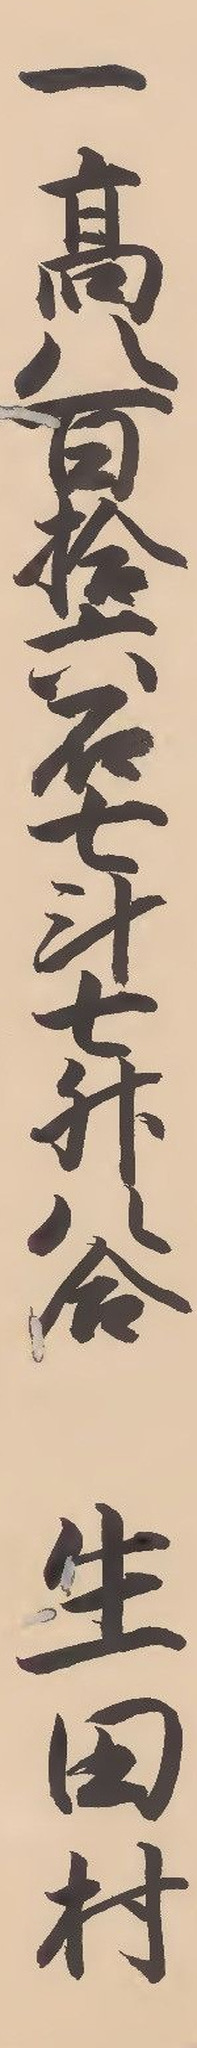一高八百拾六石七斗七升八合生田村
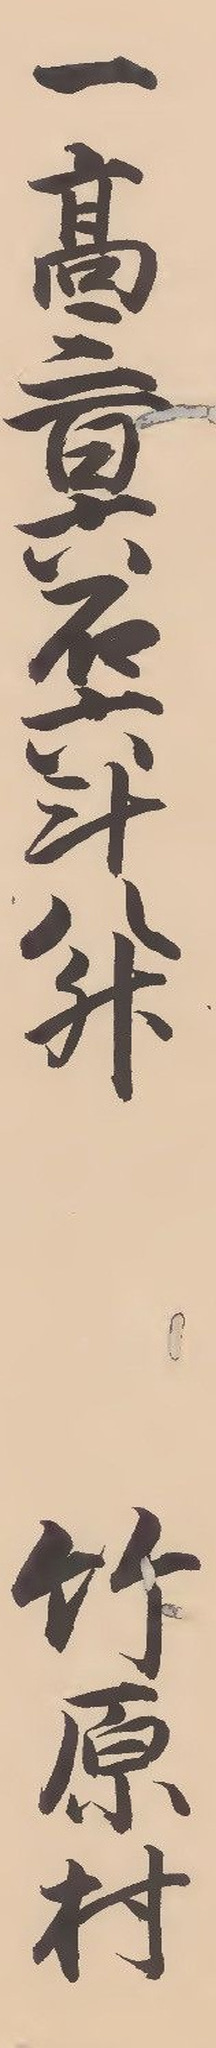一高三百六石六斗八升竹原村
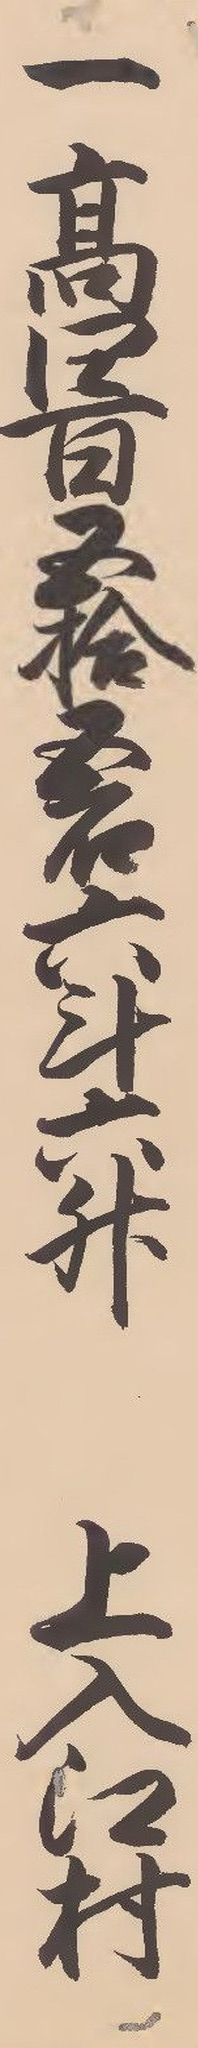一高四百五拾五石六斗六升上入江村
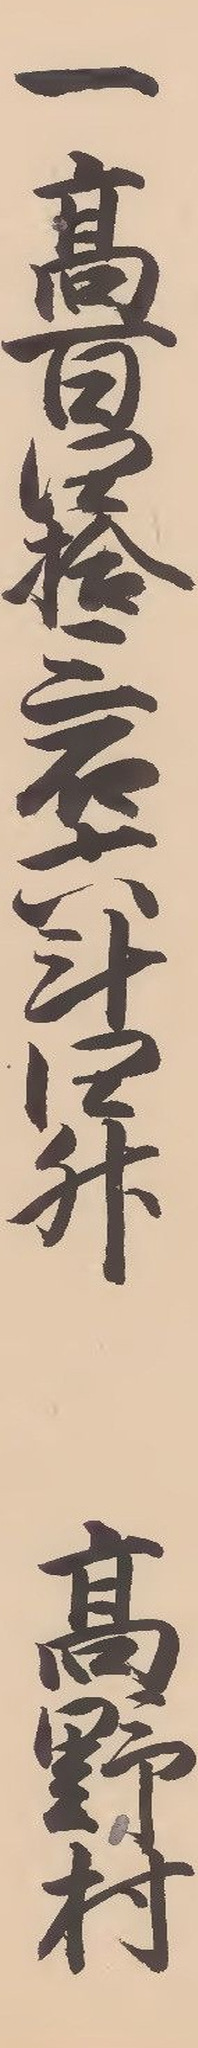一高百四拾三石六斗四升高野村
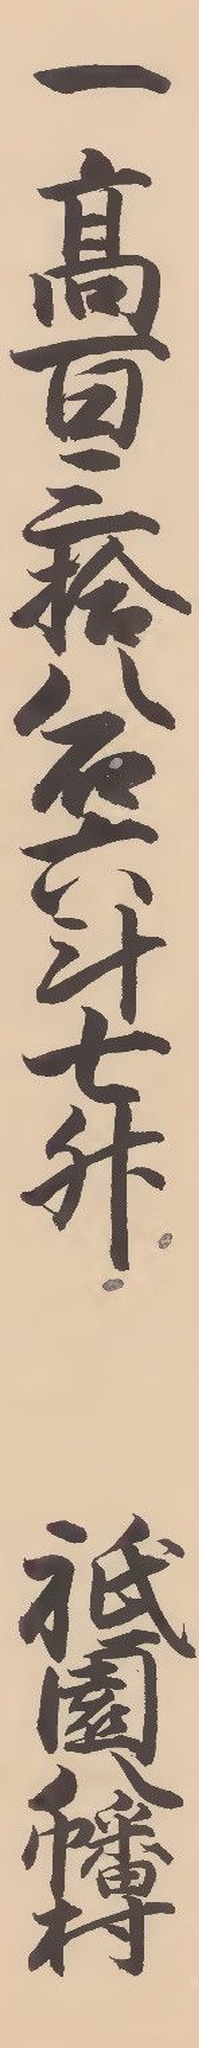一高百三拾八石六斗七升祗園八幡村

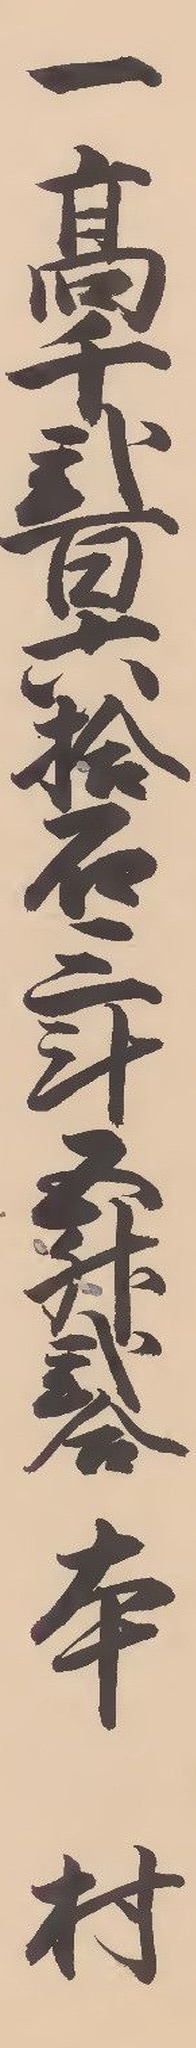一高千弐百六拾石三斗五升弐合本村
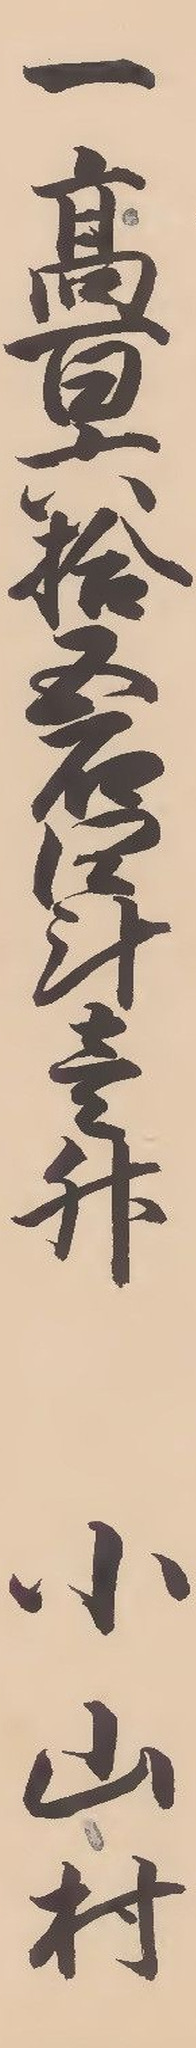一高百六拾五石四斗壱升小山村
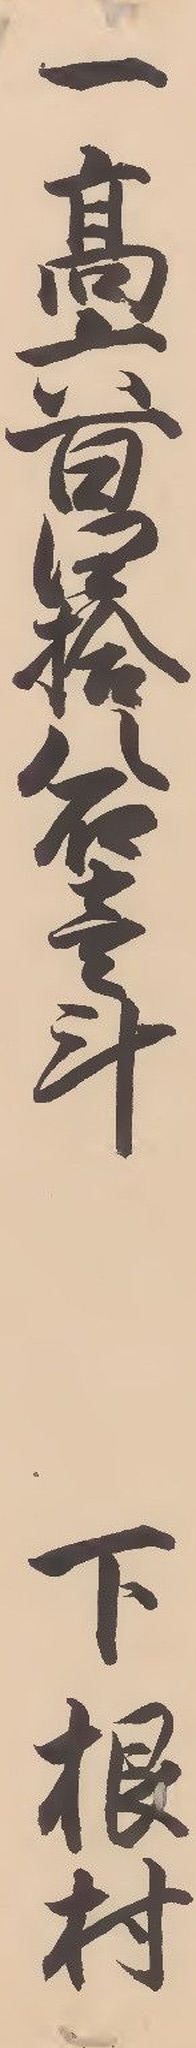一高六百四拾八石壱斗下根村
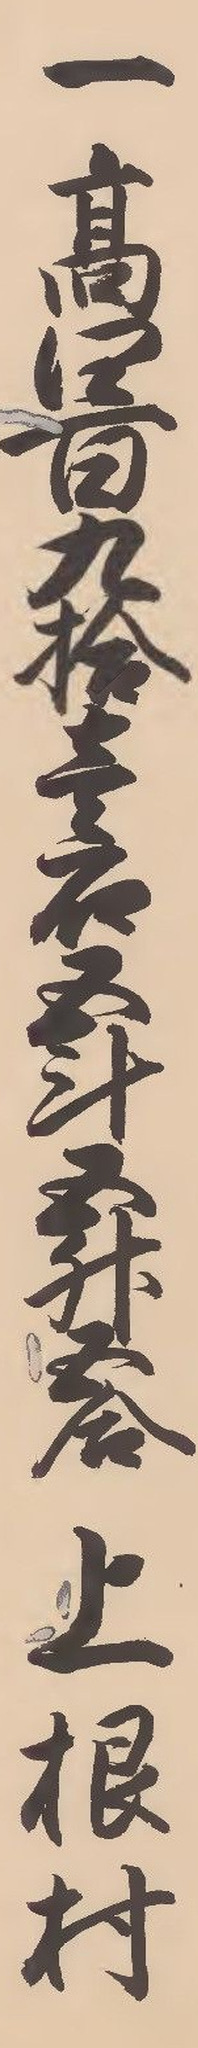一高四百九拾壱石五斗五升五合上根村
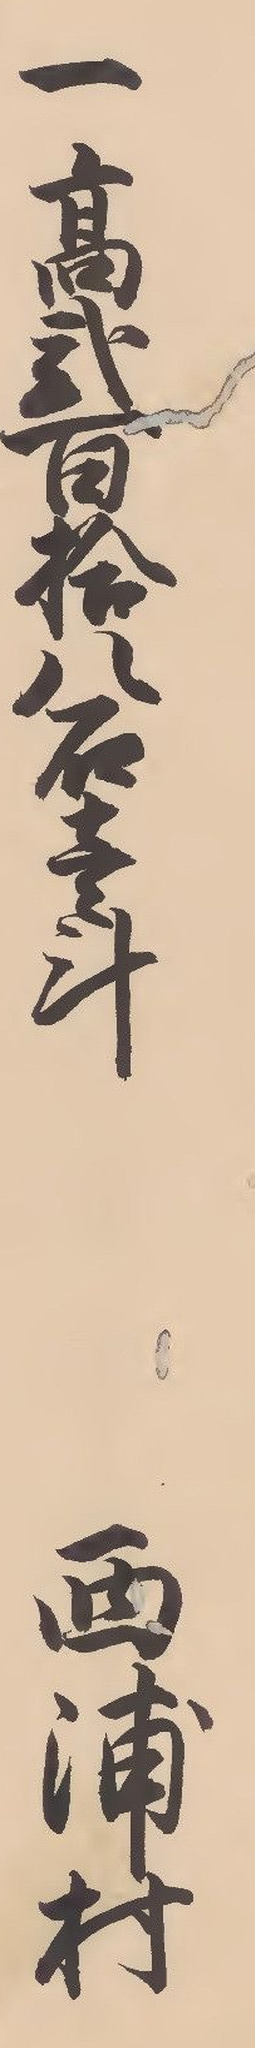一高弐百拾八石壱斗西浦村
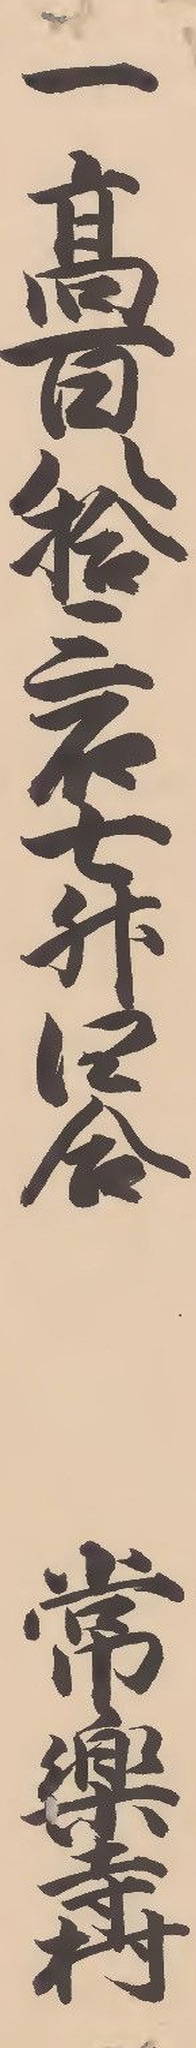一高百八拾三石七升四合常楽寺村
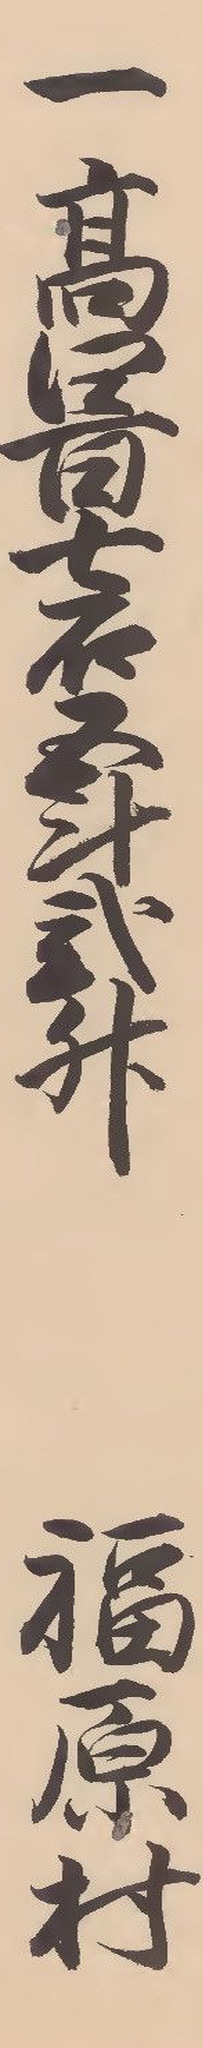一高四百七石五斗弐升福原村
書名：安芸国郷帳
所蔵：国立公文書館 National Archives of Japan
